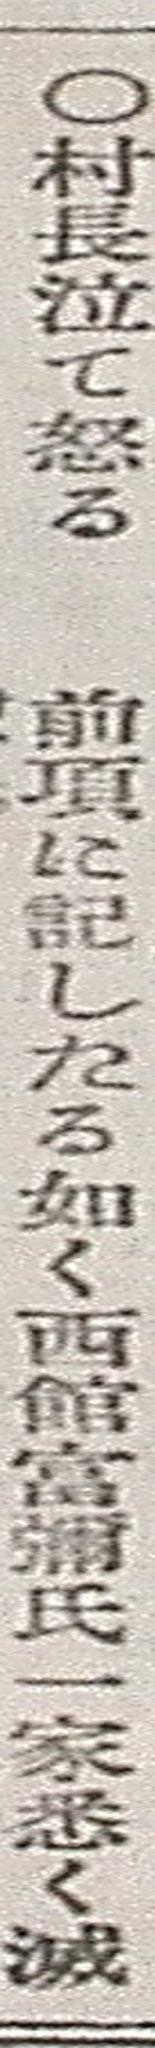○村長泣て怒る前項に記したる如く西舘富彌氏一家悉く滅
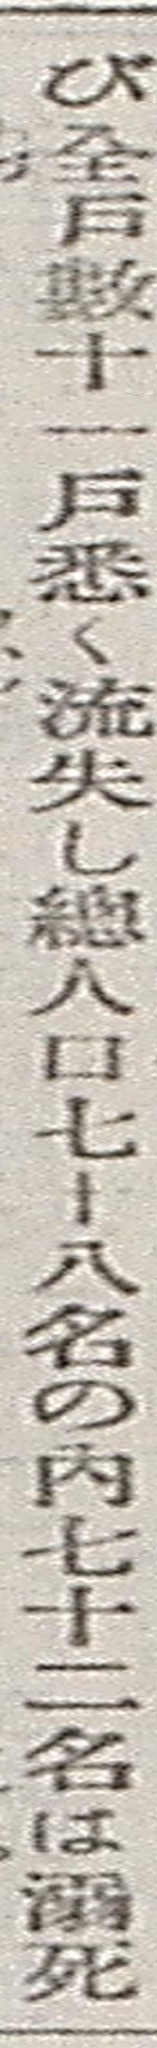び全戸数十一戸悉く流失し総人口七十八名の内七十二名は溺死
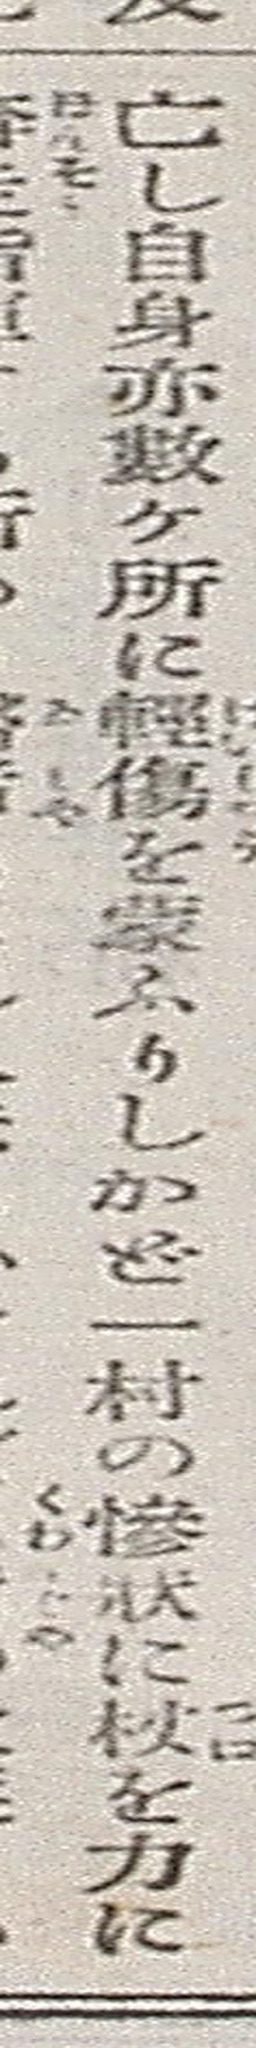亡し自身亦数ヶ所に軽傷を蒙ふりしかど一村の惨状に杖を力に
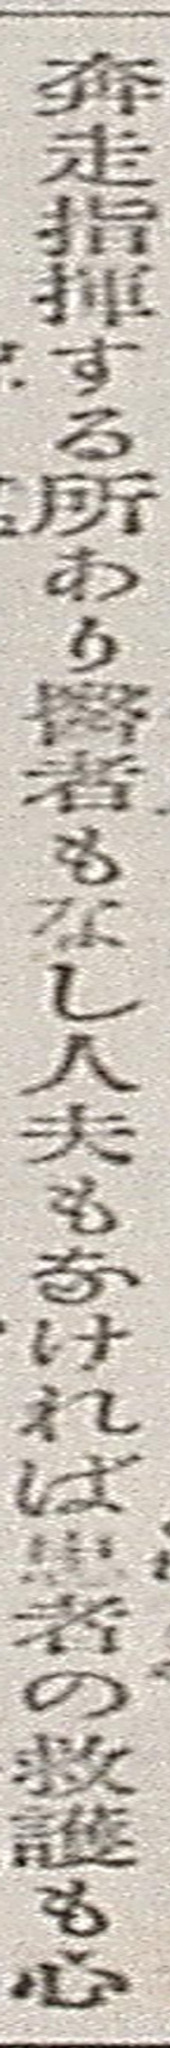奔走指揮する所あり医者もなし人夫もなければ患者の救護も心
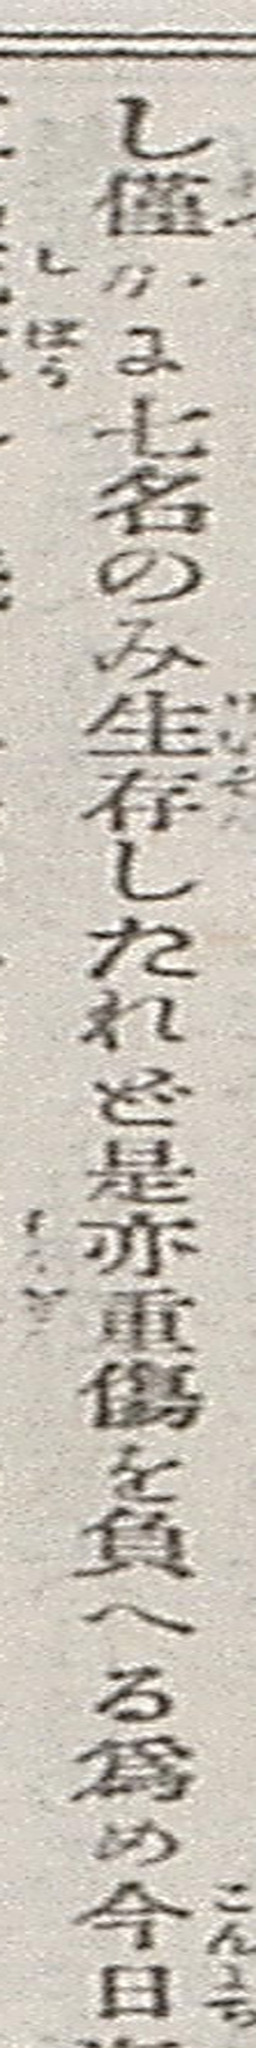し僅かに七名のみ生存したれど是亦重傷を負へる為め今日迄に
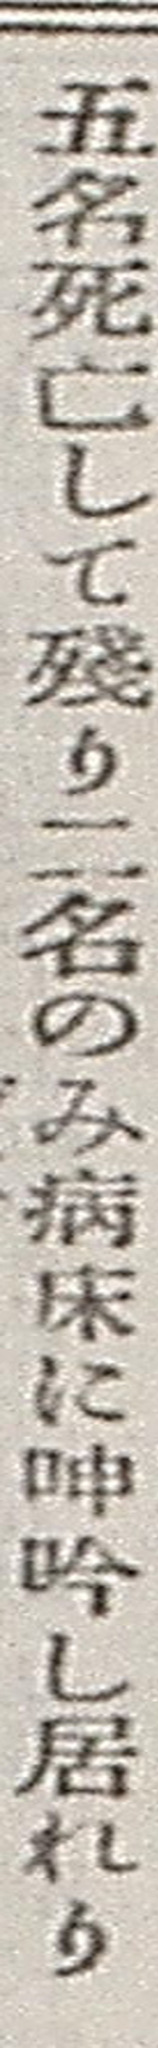五名死亡して残り二名のみ病床に呻吟し居れり
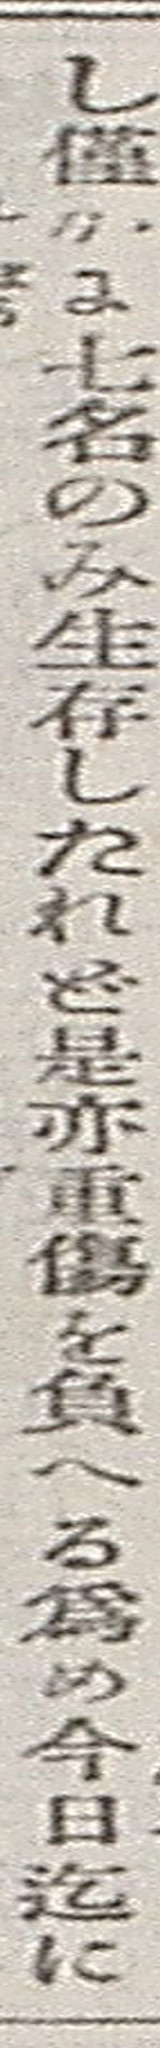し僅かに七名のみ生存したれど是亦重傷を負へる為め今日迄に
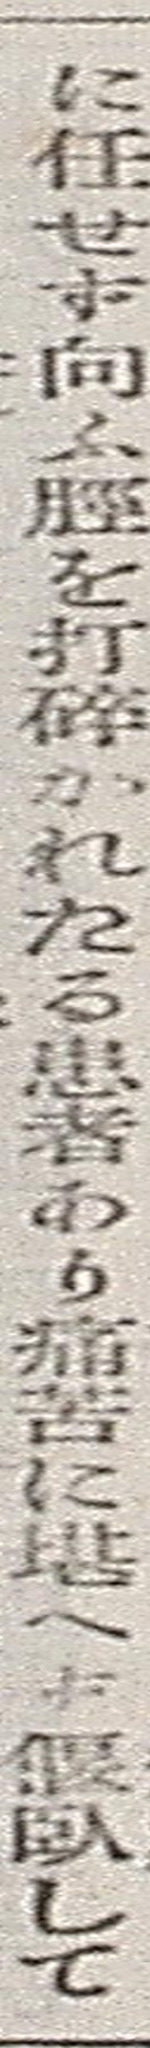に任せず向ふ脛を打砕かれたる患者あり痛苦に堪へず偃臥して
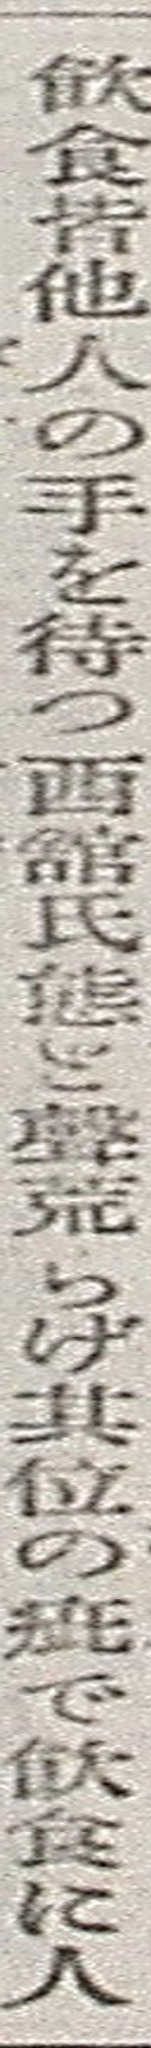飲食皆他人の手を待つ西舘氏態と声荒らげ其位の疵で飲食に人
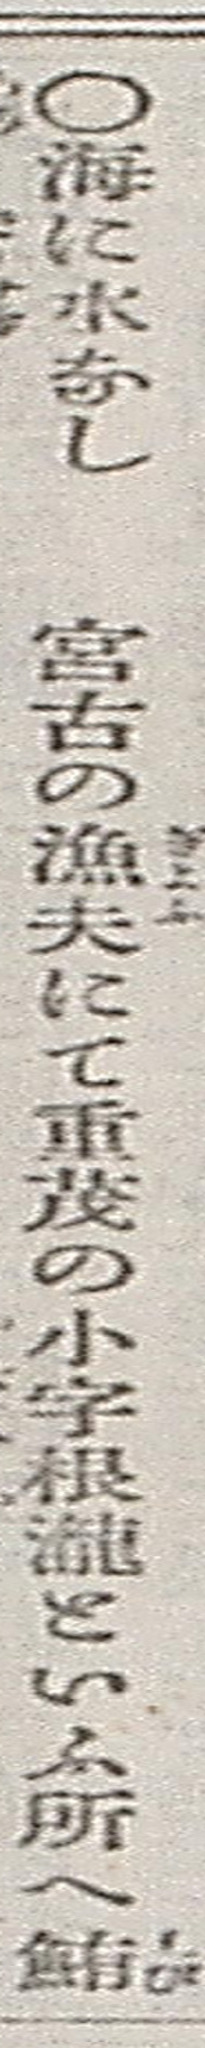○海に水なし宮古の漁夫にて重茂の小字根瀧といふ所へ鮪
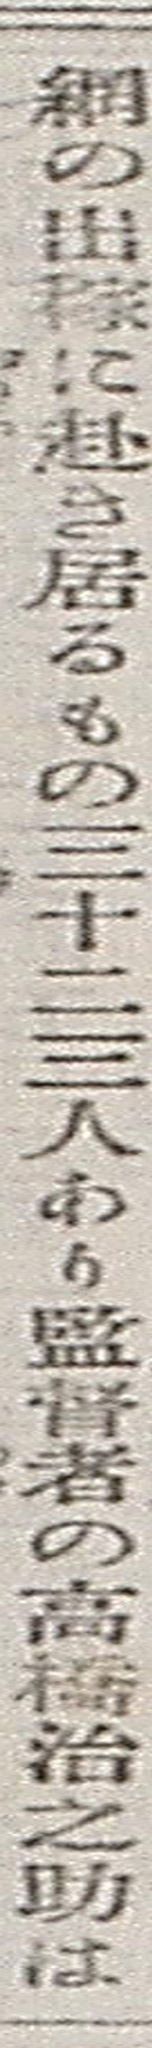網の出稼に赴き居るもの三十二三人あり監督者の高橋治之助は
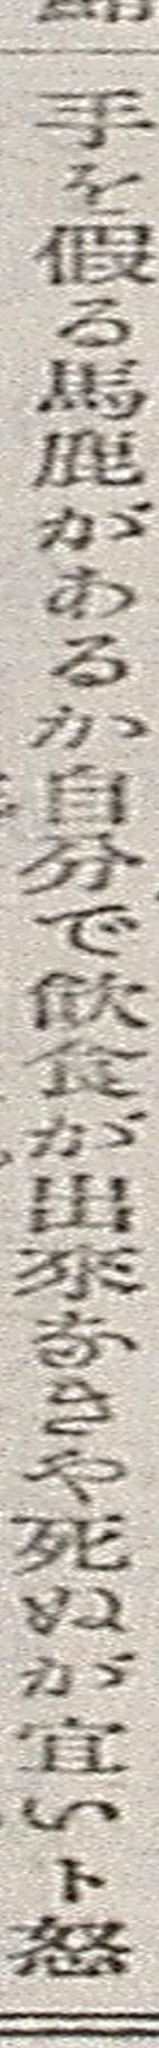手を仮る馬鹿があるか自分で飲食が出来なきや死ぬが宜いト怒
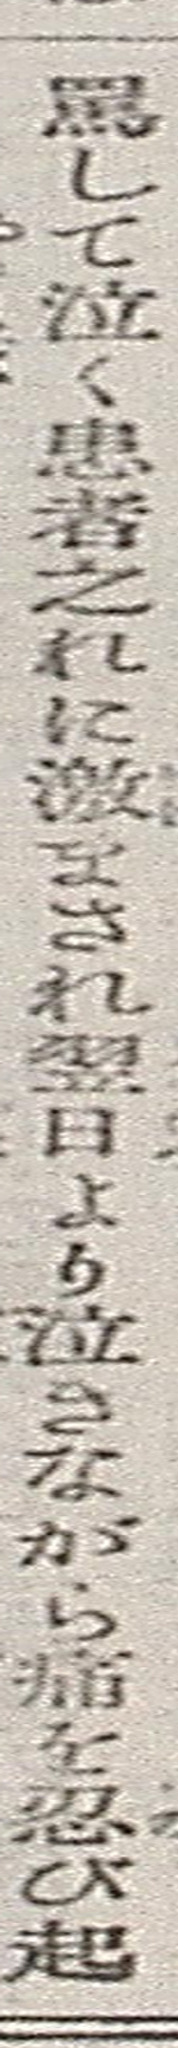罵して泣く患者之れに激まされ翌日より泣きながら痛を忍び起
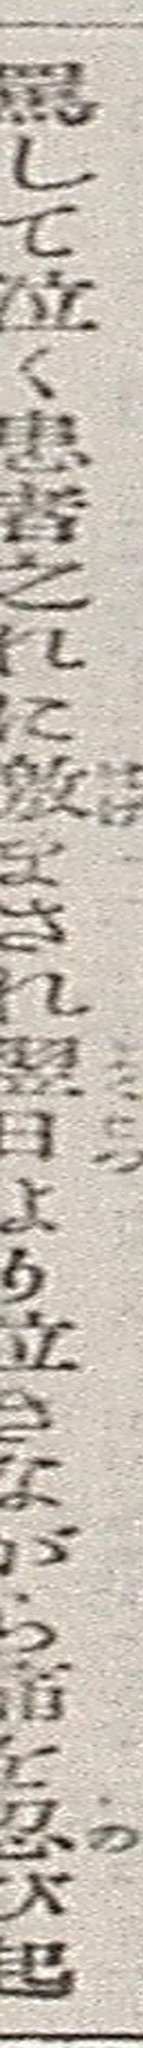罵して泣く患者之れに激まされ翌日より泣きながら痛を忍び起
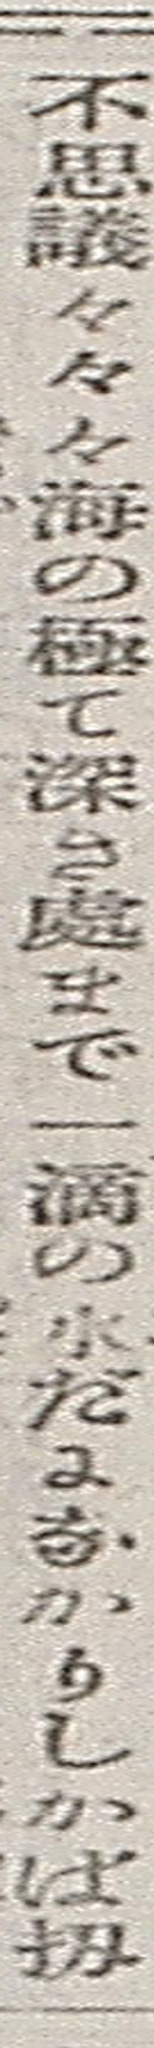不思議々々海の極て深き処まで一滴の水だになかりしかば扨
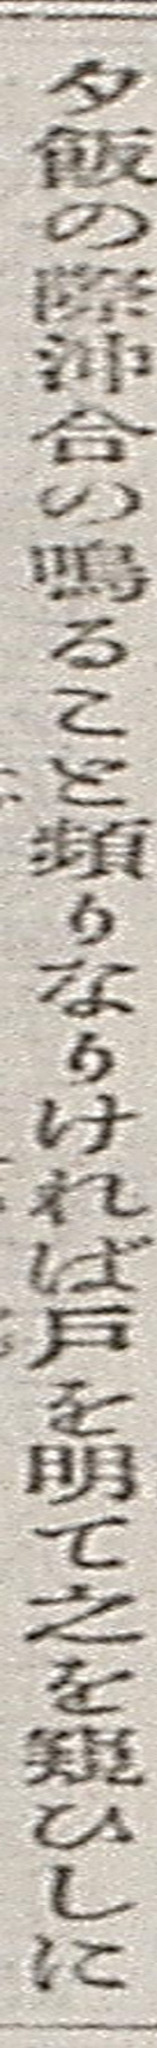夕飯の際沖合の鳴ること頻りなりければ戸を明て之を窺ひしに
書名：風俗畫報臨時増刊第百二十號　大海嘯被害録（下）
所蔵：東京大学地震研究所図書室 Earthquake Research Institute Library, The University of Tokyo, JAPAN
